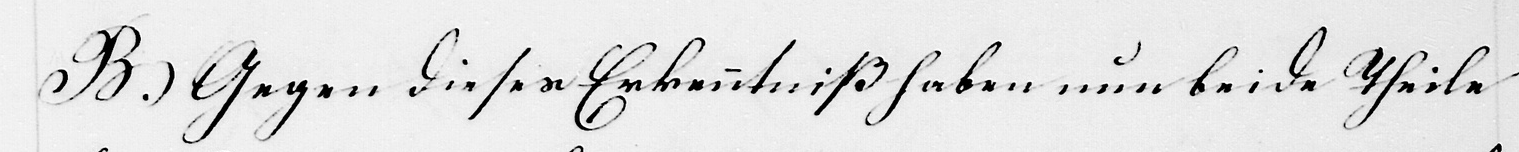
B.) Gegen dieses Erkenntniß haben nun beide Theile
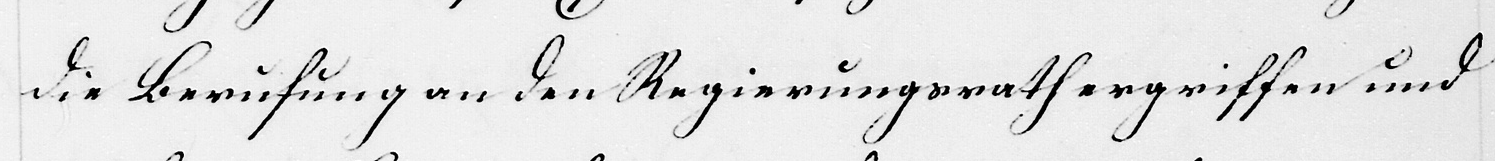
die Berufung an den Regierungsrath ergriffen und
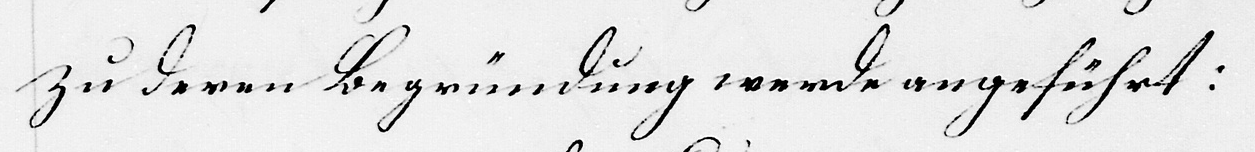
zu deren Begründung werde angeführt:
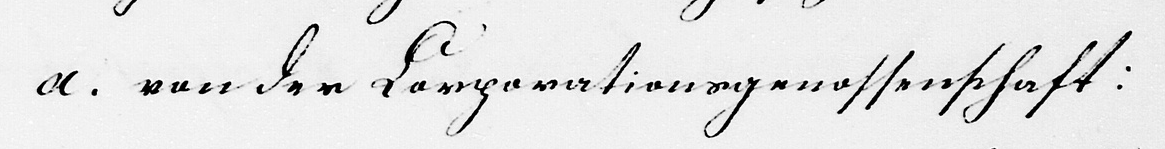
a. von der Corporationsgenossenschaft:
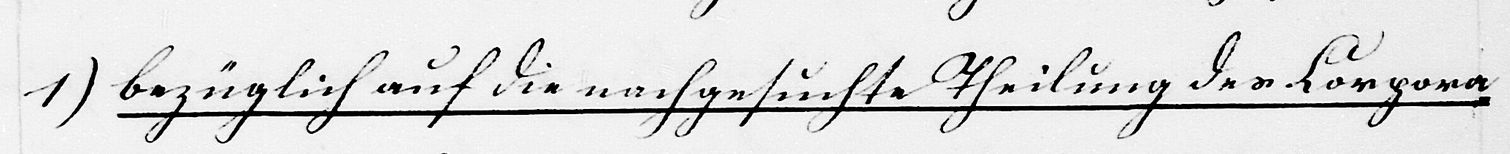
1.) bezüglich auf die nachgesuchte Theilung des Corpora¬
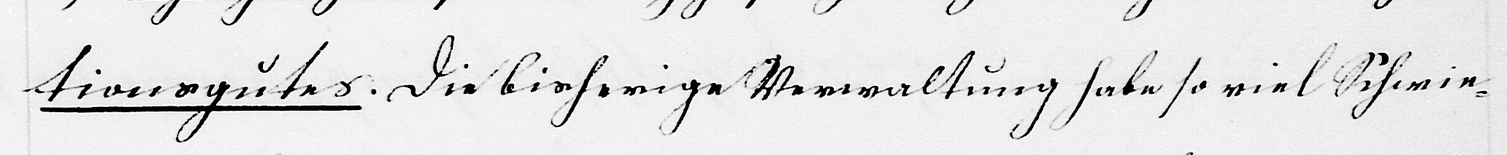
tionsgutes. Die bisherige Verwaltung habe so viel Schwie¬
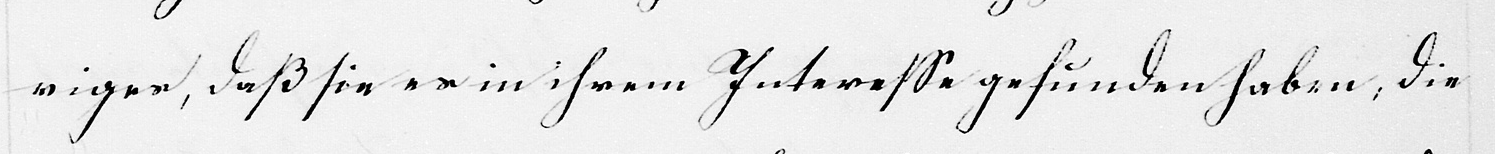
riges, daß sie es in ihrem Intereße gefunden haben, die
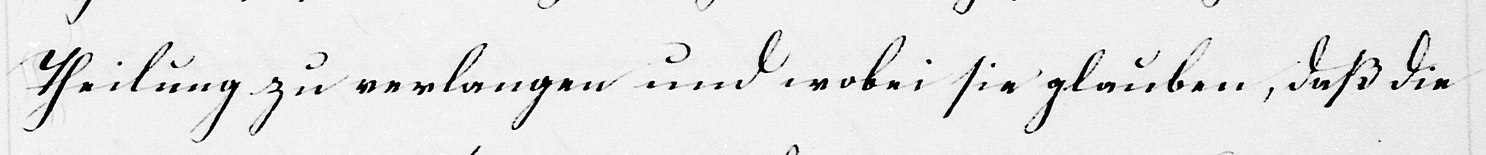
Theilung zu verlangen und wobei sie glauben, daß die
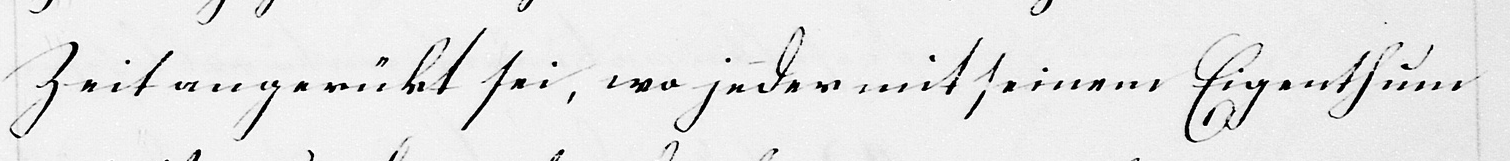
Zeit angerückt sei, wo jeder mit seinem Eigenthum
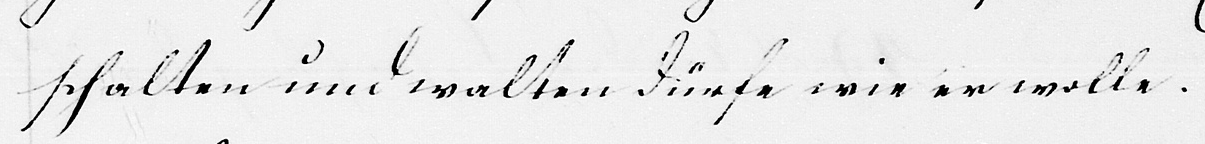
schalten und walten dürfe wie er wolle.
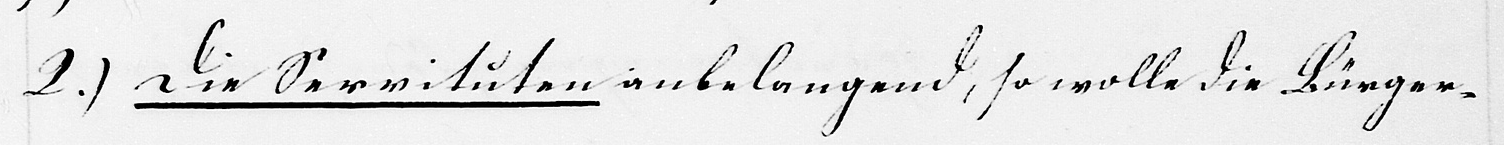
2.) Die Servituten anbelangend, so wolle die Bürger¬
